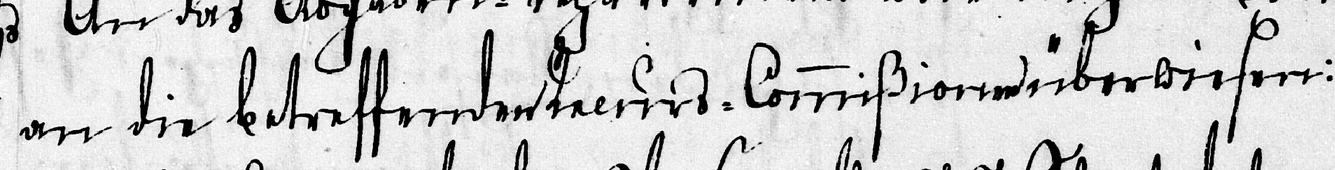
an die betreffenden Recurs-Commißionen überwiesen:
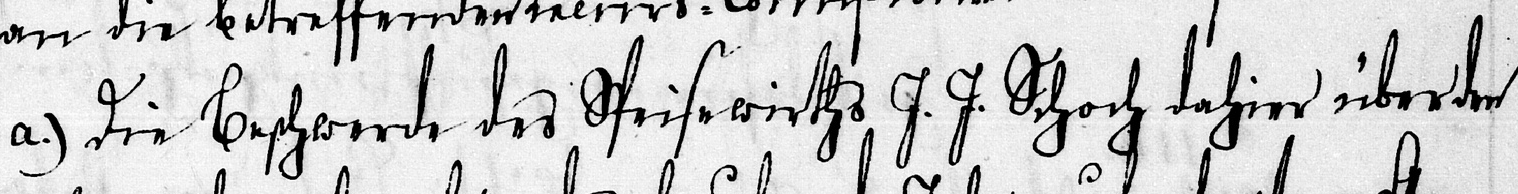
a.) Die Beschwerde des Speisewirths J. J. Schoch dahier über den
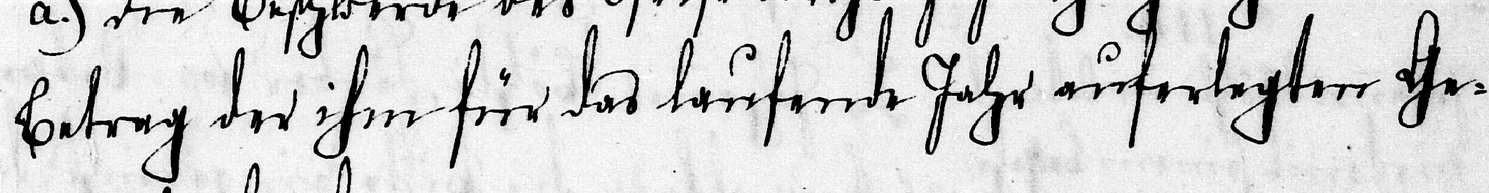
Betrag der ihm für das laufende Jahr auferlegten Ge¬
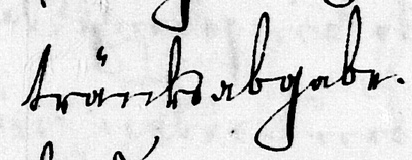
tränksabgabe.
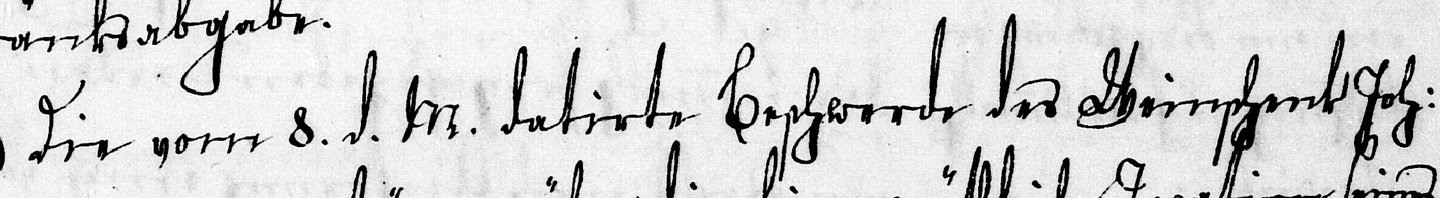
Die vom 8. d. M. datirte Beschwerde des Weinschenk Joh:
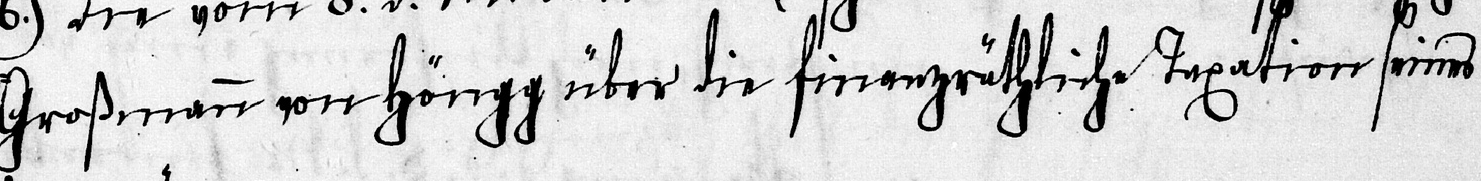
Großmann von Höngg über die finanzräthliche Taxation seines
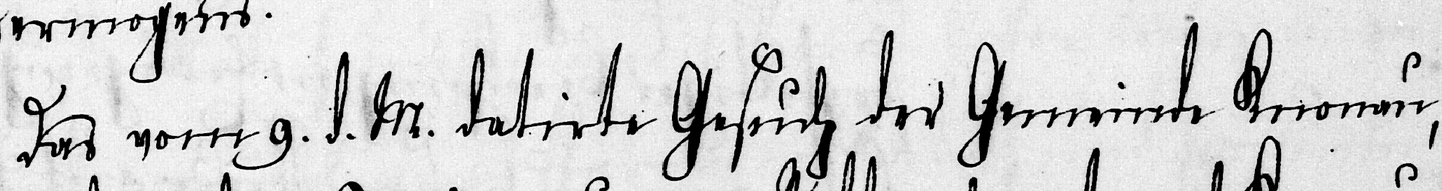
Das vom 9. d. M. datirte Gesuch der Gemeinde Knonau,
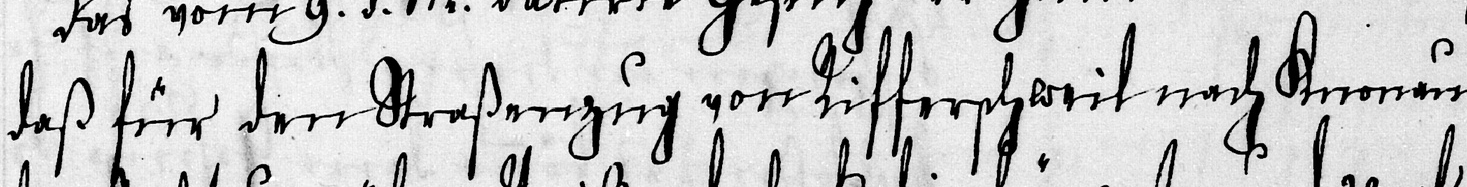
daß für den Straßenzug von Rifferschweil nach Knonau
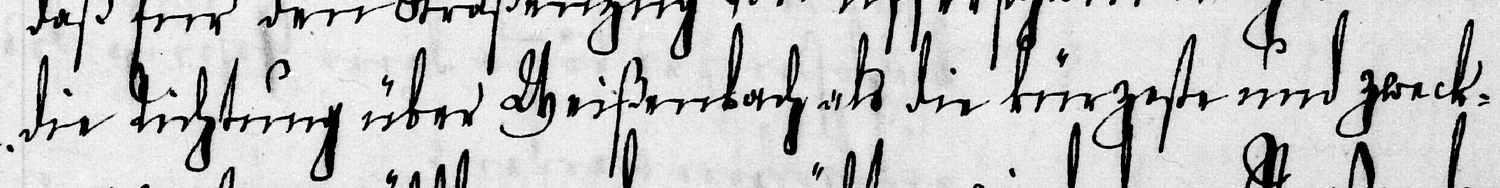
die Richtung über Weißenbach als die kürzeste und zweck¬
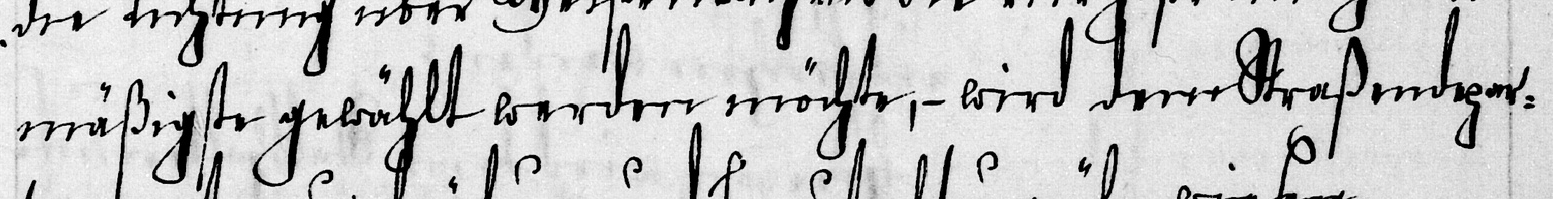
mäßigste gewählt werden möchte, – wird dem Straßendepar¬
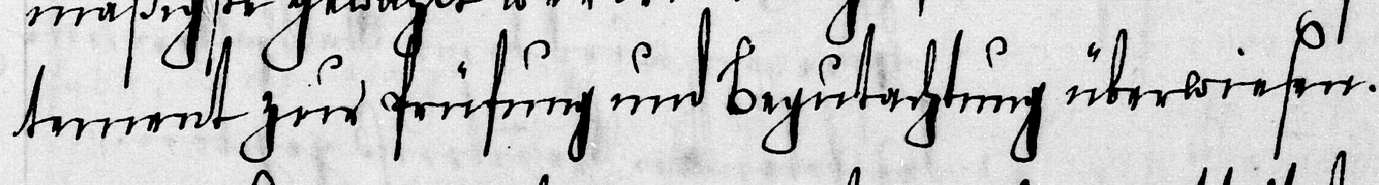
tement zur Prüfung und Begutachtung überwiesen.
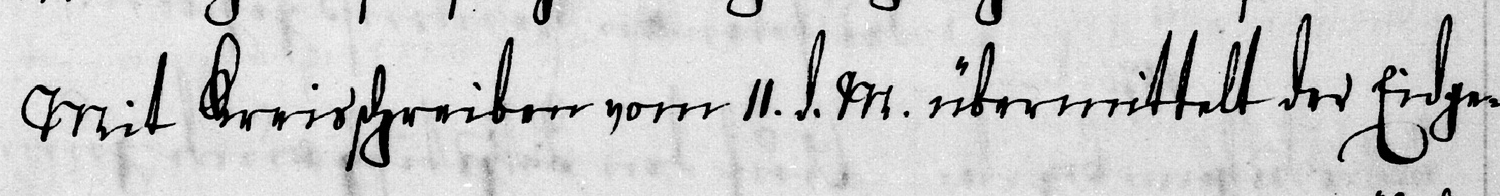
Mit Kreisschreiben vom 11. d. M. übermittelt der Eidge-
